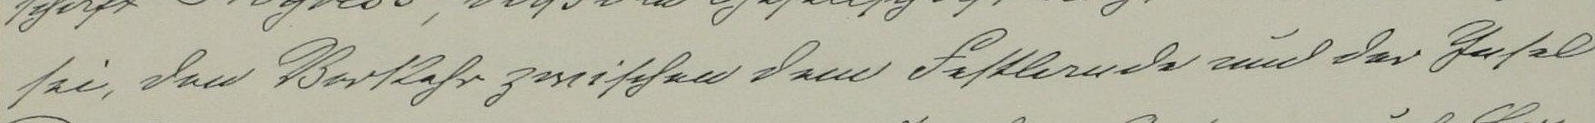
sei, den Verkehr zwischen dem Festlande und der Insel
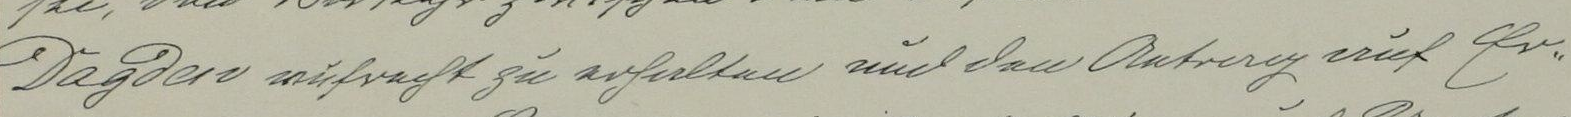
Dagden aufrecht zu erhalten, und den Antrag auf Er-
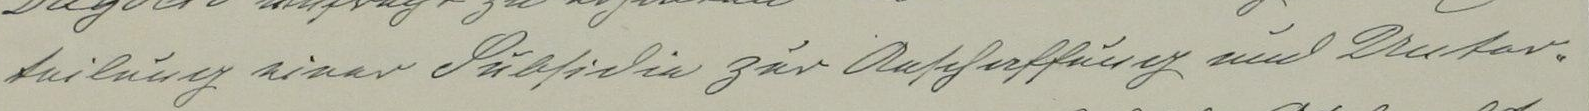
teilung einer Subsidie zur Anschaffung und Unter-
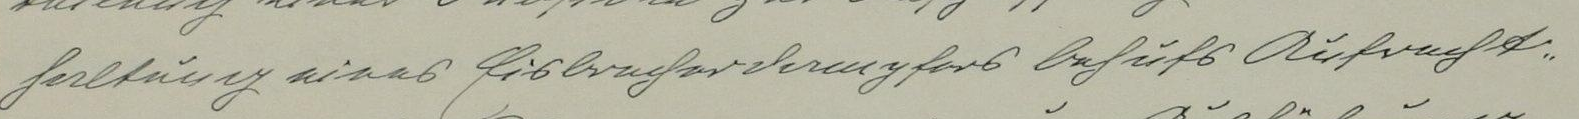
haltung eines Eisbrecherdampfers behufs Aufrecht-
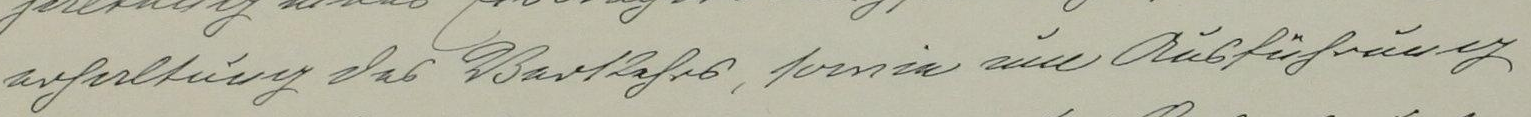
erhaltung des Verkehrs, sowie um Ausführung
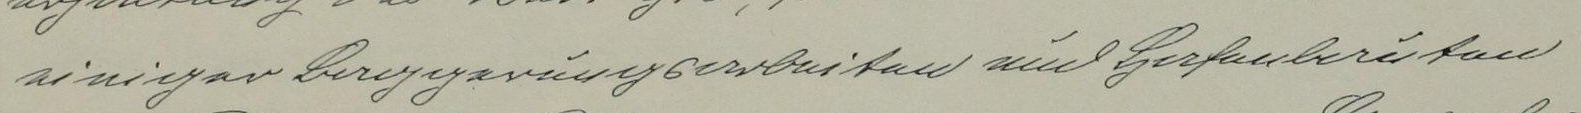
einiger Baggerungsarbeiten und Hafenbauten
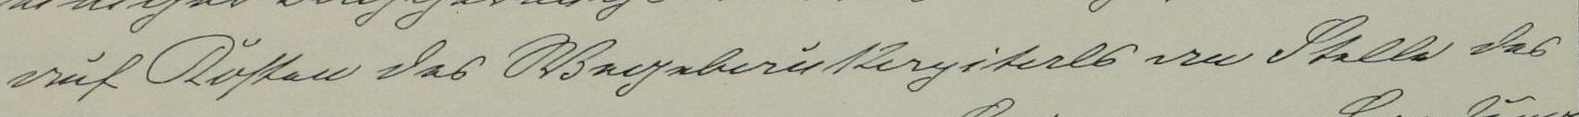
auf Kosten des Wegebaukapitals an Stelle des
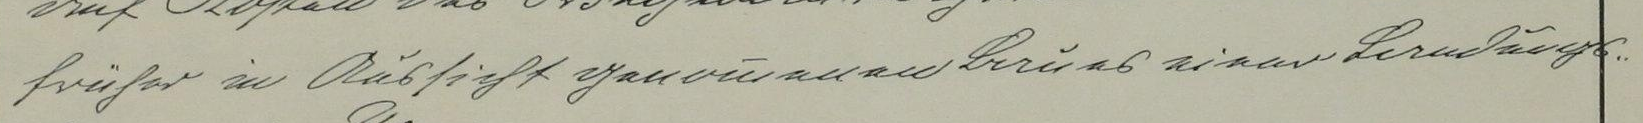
früher in Aussicht genommenen Baues einer Landungs-
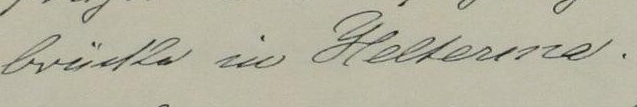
brücke in Helterma.
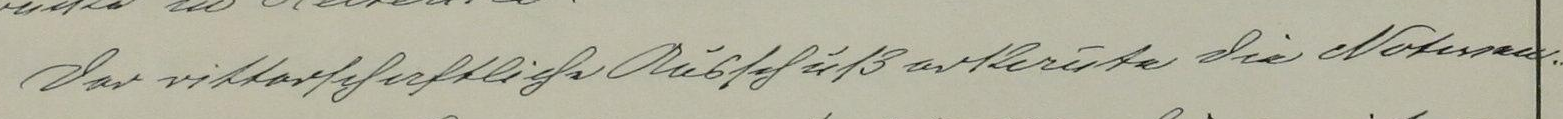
Der ritterschaftliche Ausschuß erkannte die Notwen-
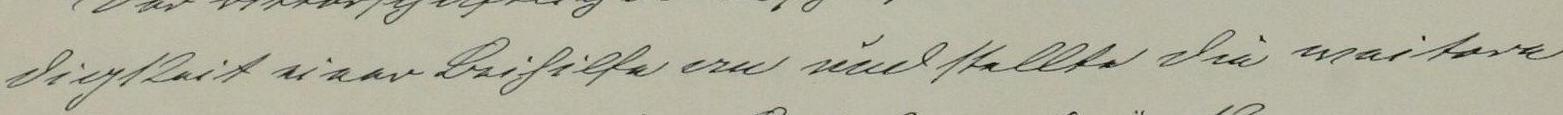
digkeit einer Beihilfe an und stellte die weitere
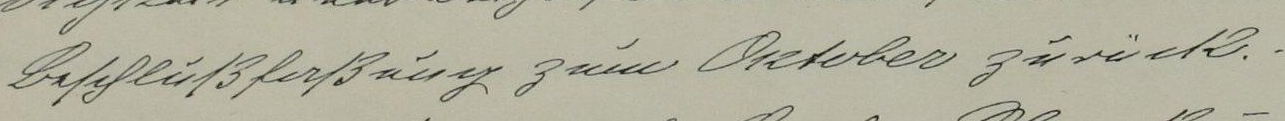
Beschlußfaßung zum Oktober zurück.
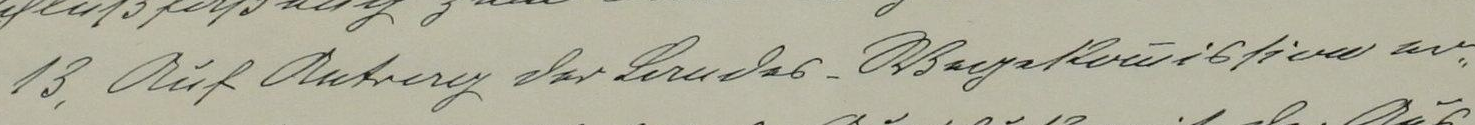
13. Auf Antrag der Landes-Wegekommission er-
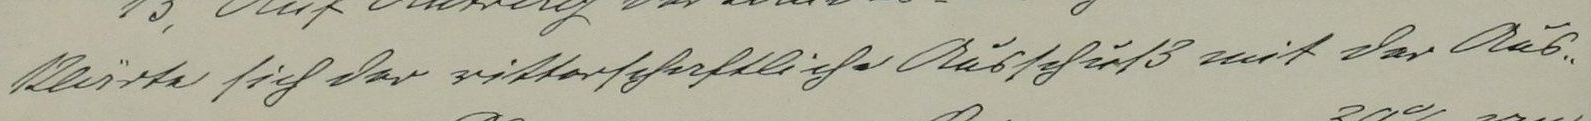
klärte sich der ritterschaftliche Ausschuß mit der Aus-
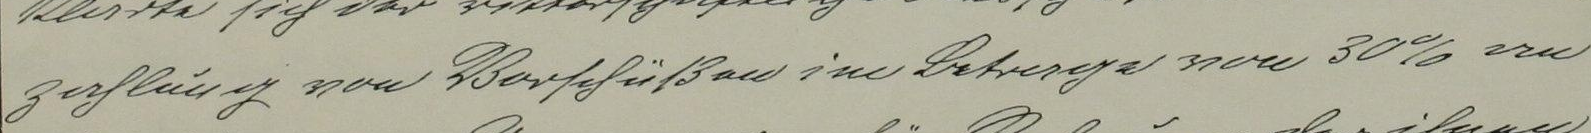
zahlung von Vorschüßen im Betrage von 30% an
